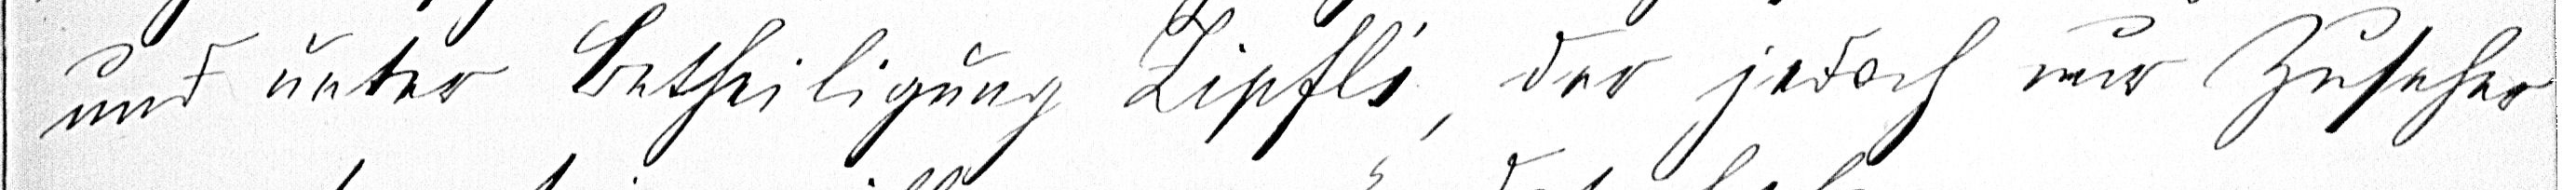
und unter Betheiligung Zipfl's, der jedoch nur Zuseher
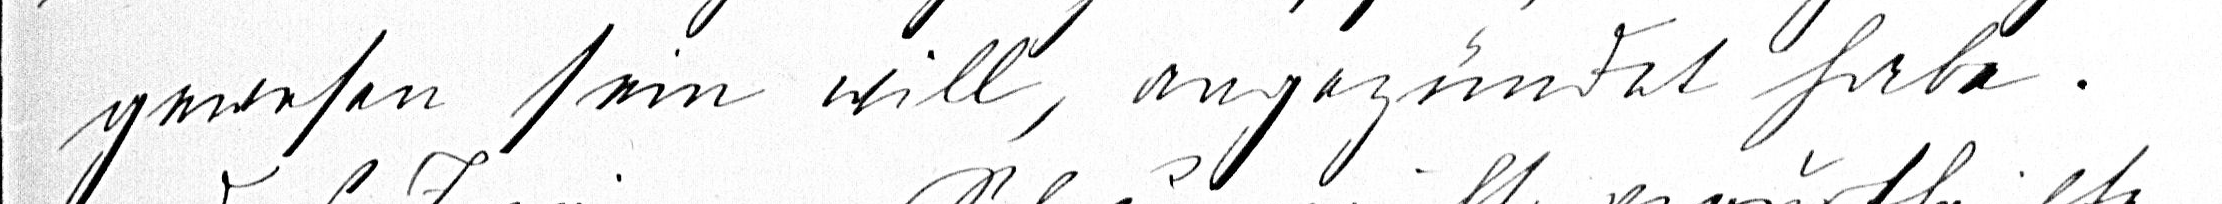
gewesen sein will, angezündet habe.
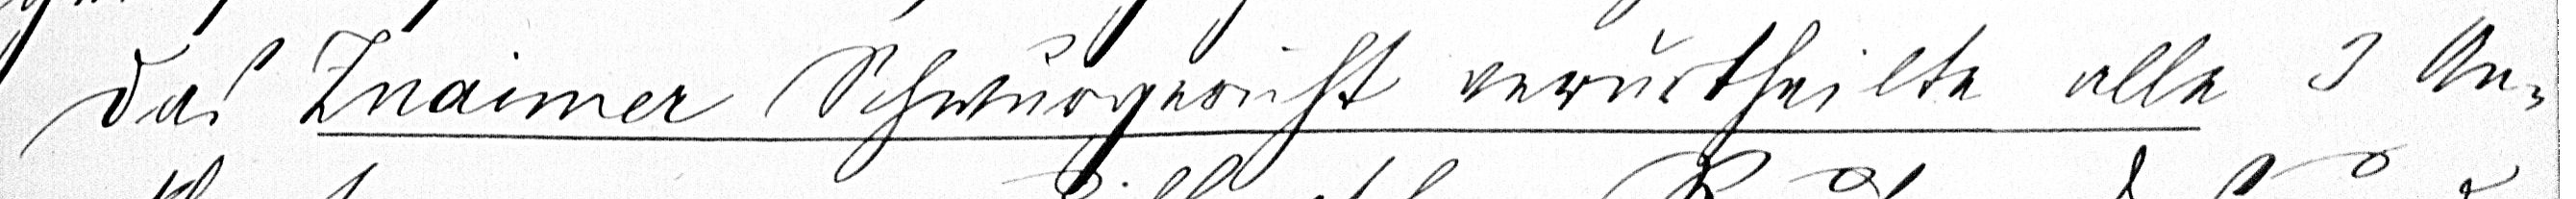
Das Znaimer Schwurgericht verurtheilte alle 3 An¬
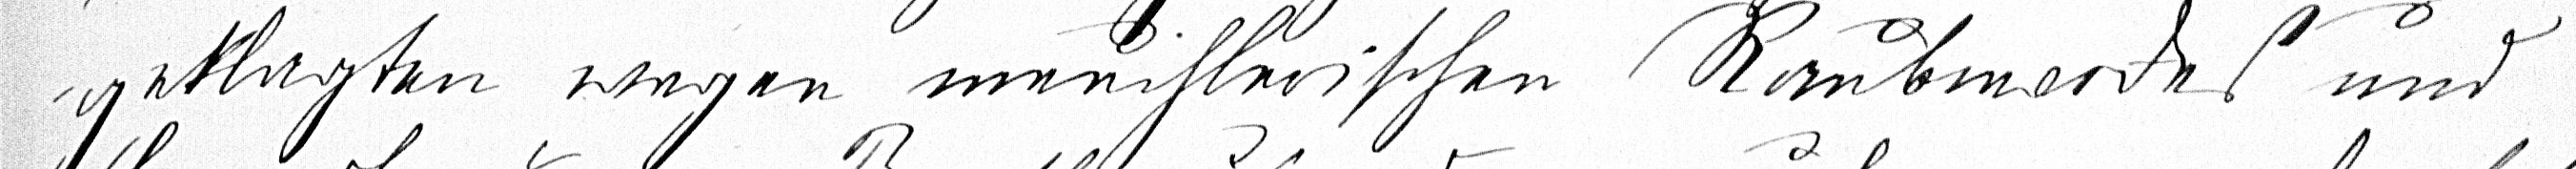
geklagten wegen meuchlerischen Raubmordes und
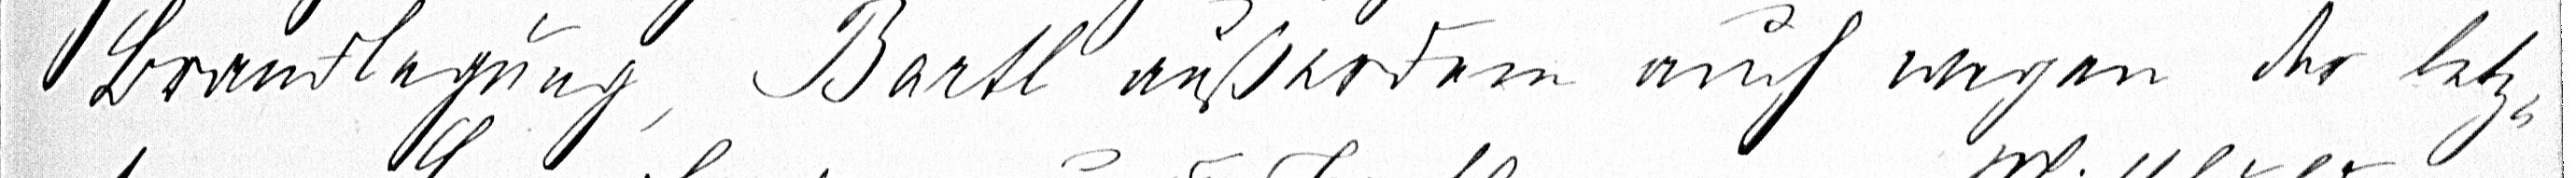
Brandlegung, Bartl außerdem auch wegen der letz¬
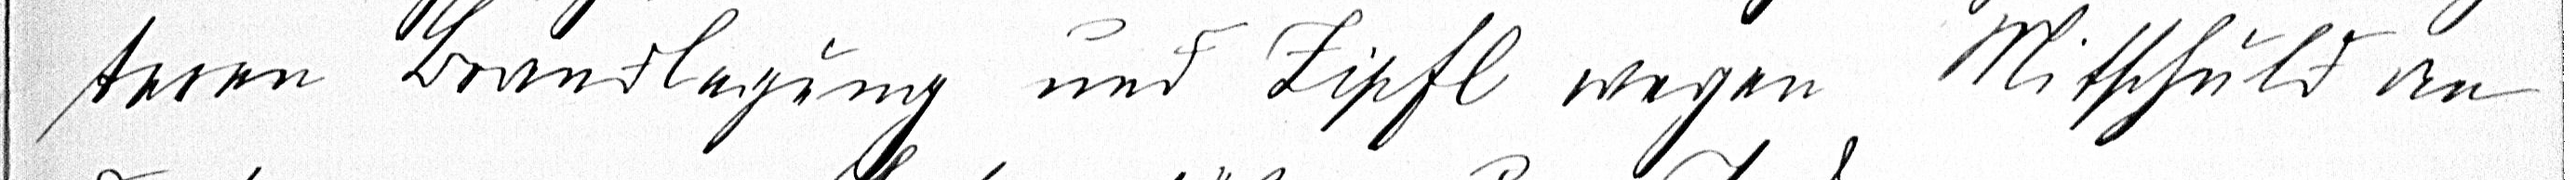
teren Brandlegung und Zipfl wegen Mitschuld an
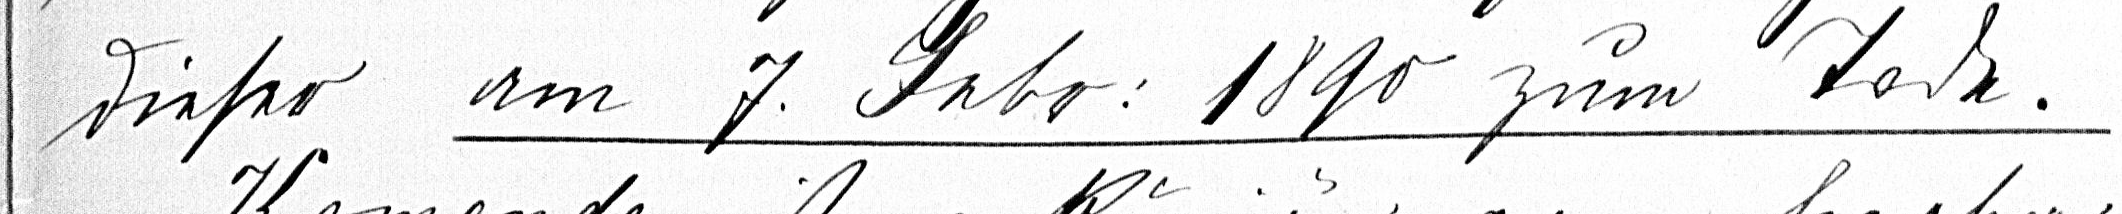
dieser am 7. Febr. 1890 zum Tode.
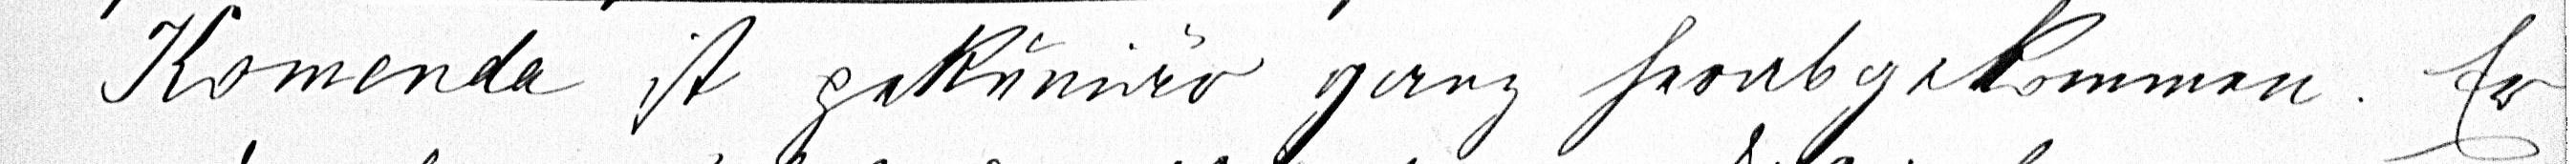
Komenda ist pekuniär ganz herabgekommen. Er
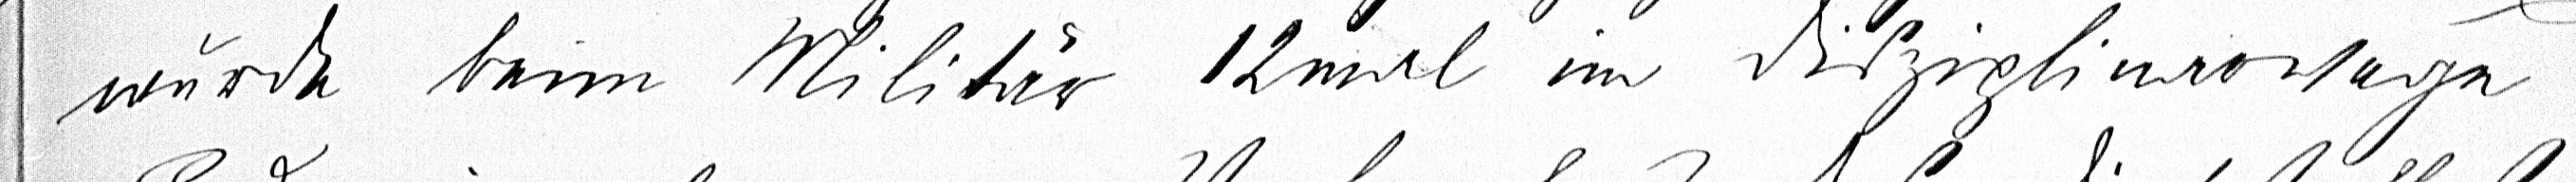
wurde beim Militär 12mal im Disziplinarwege
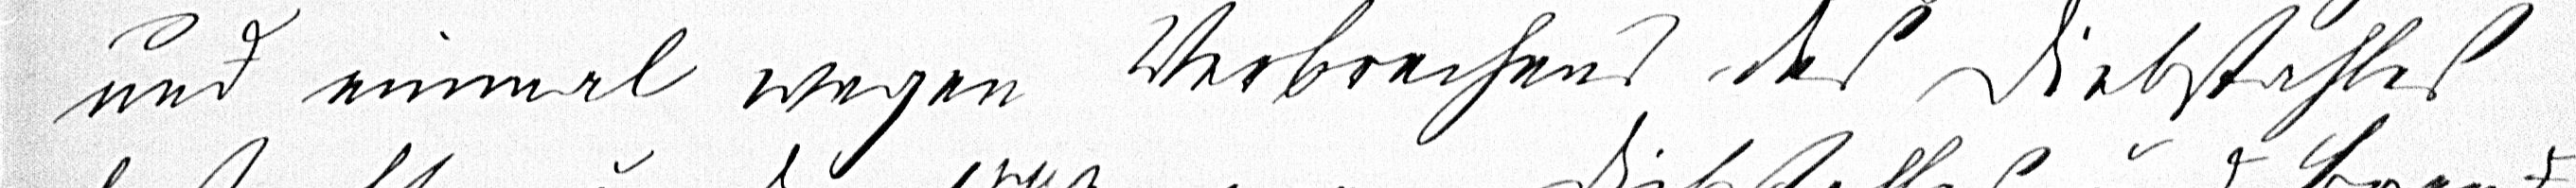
und einmal wegen Verbrechens des Diebstahles
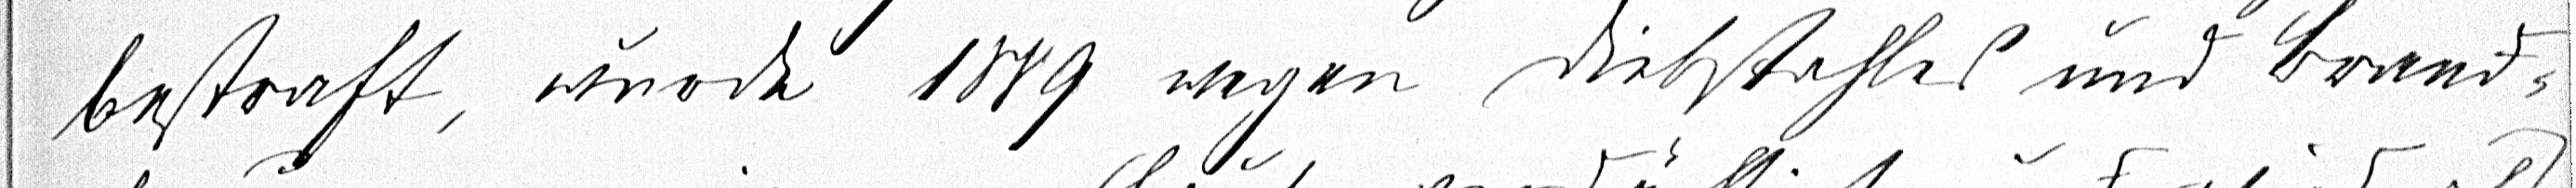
bestraft, wurde 1889 wegen Diebstahles und Brand¬
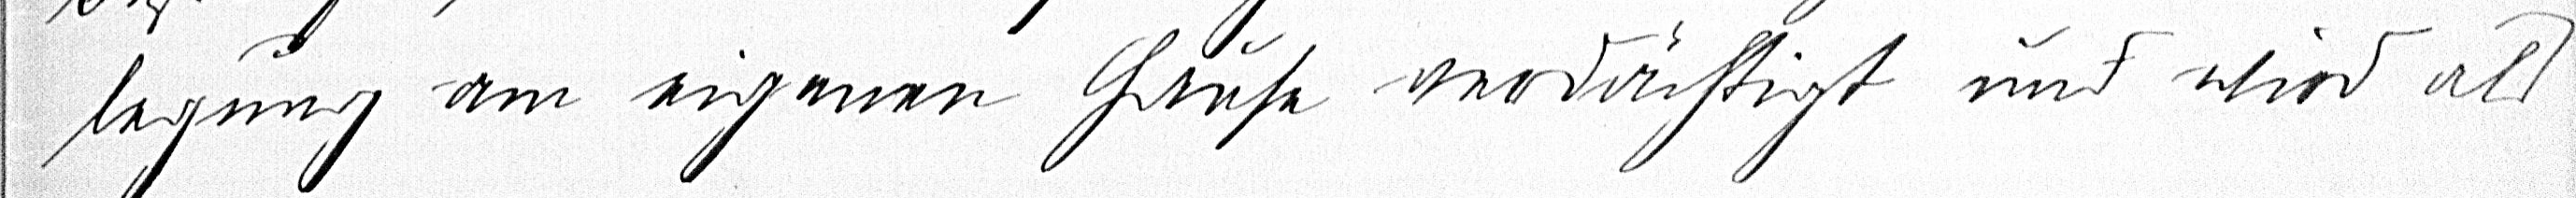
legung am eigenen Hause verdächtigt und wird als
